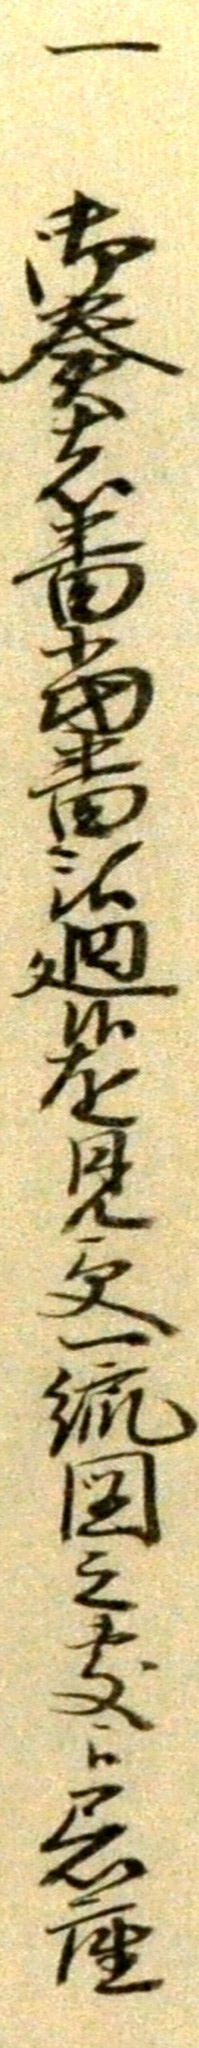一御奏者番当番被廻候を見受一統図之処え着座

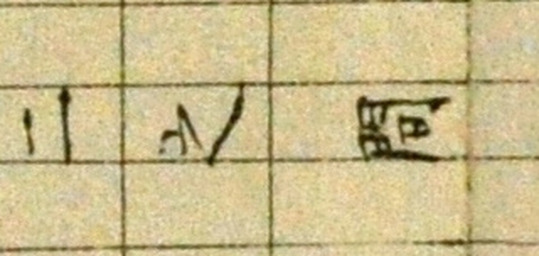二之間
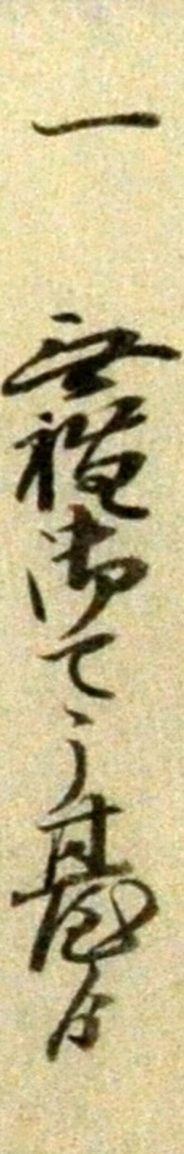一無程御てう台ゟ
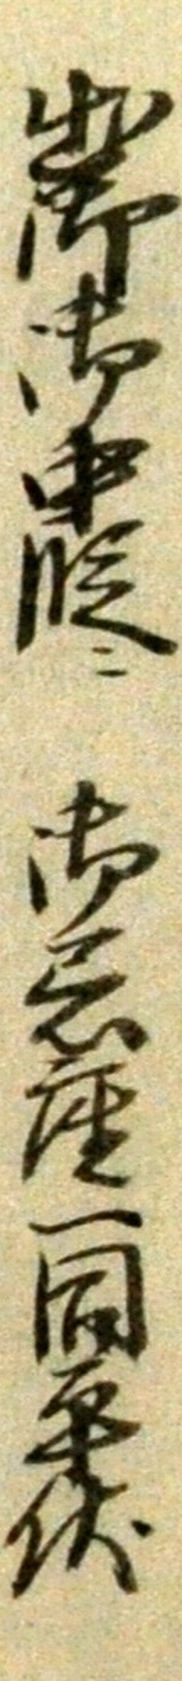出御御中段ニ御着座一同平伏
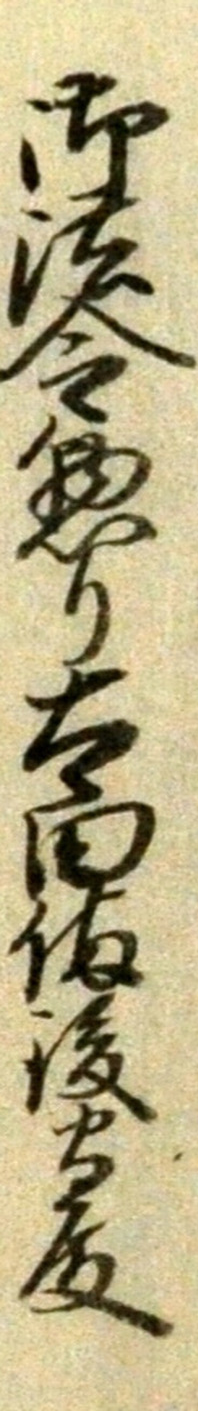御法令懸り太田佐渡守殿
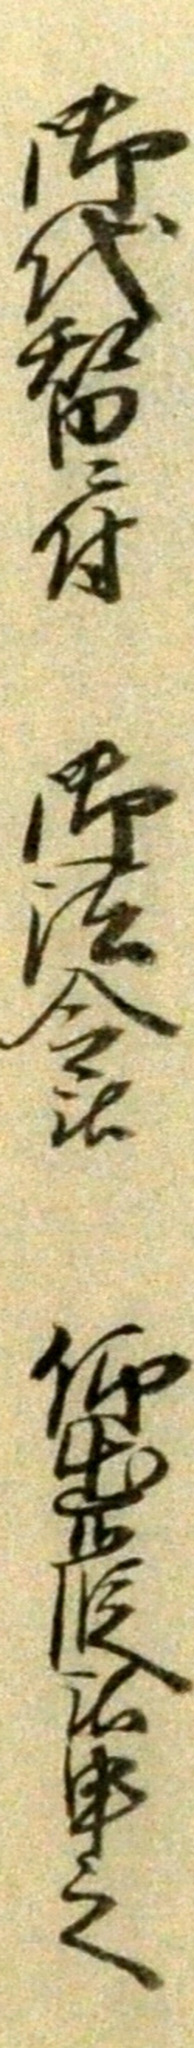御代替ニ付御法令被仰出候段被申之
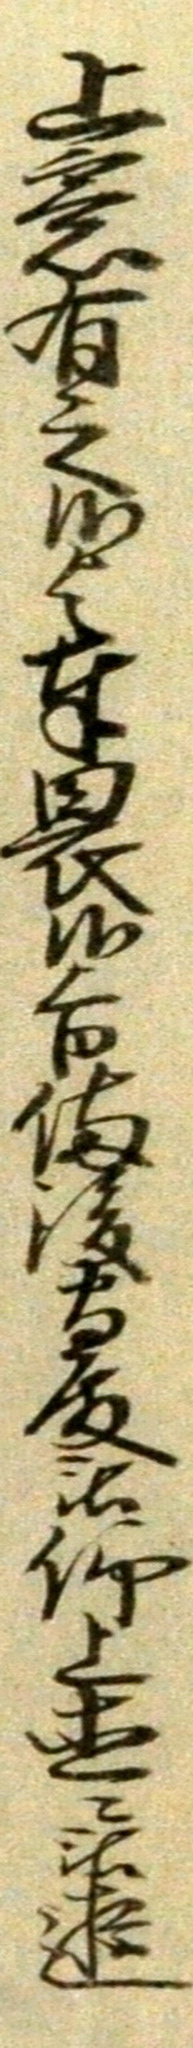上意有之候と奉畏候旨備後守殿被仰上直ニ被遊
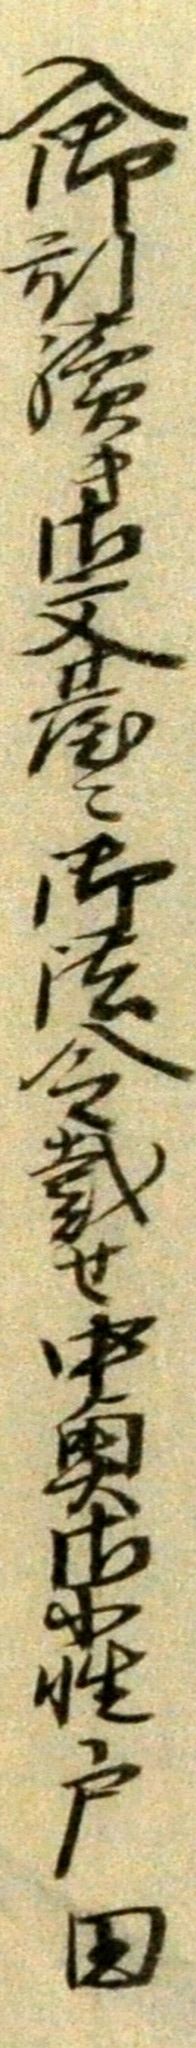入御引続キ御文台ニ御法令載せ中奥御小性戸田
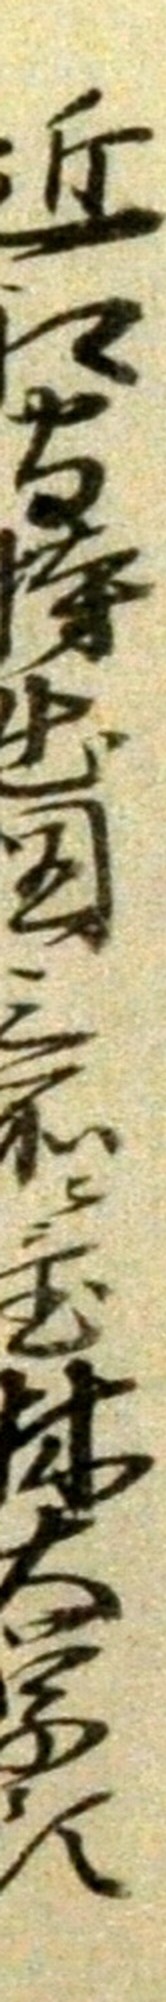近江守持出図之所ニ置林大学頭

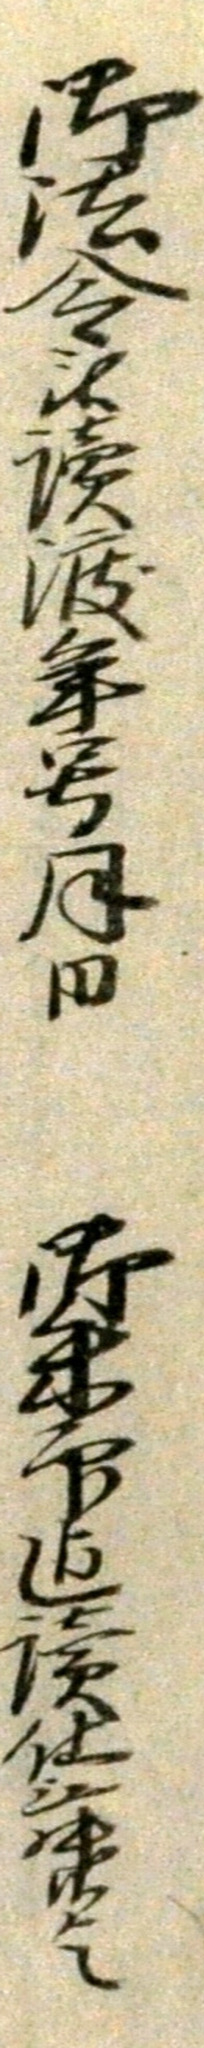御法令被読渡年号月日御朱印迄読仕被申聞之
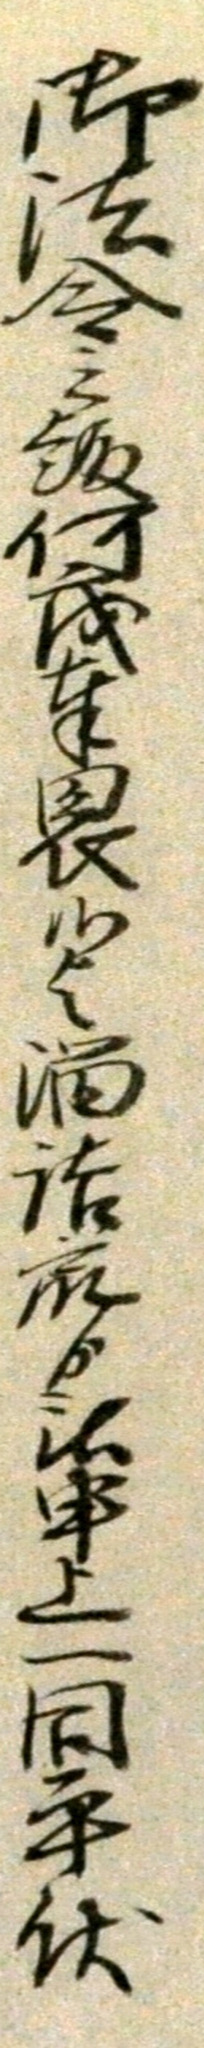御法令之趣何も奉畏候と溜詰衆ゟ被申上一同平伏
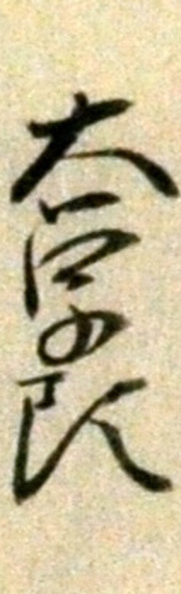大学頭
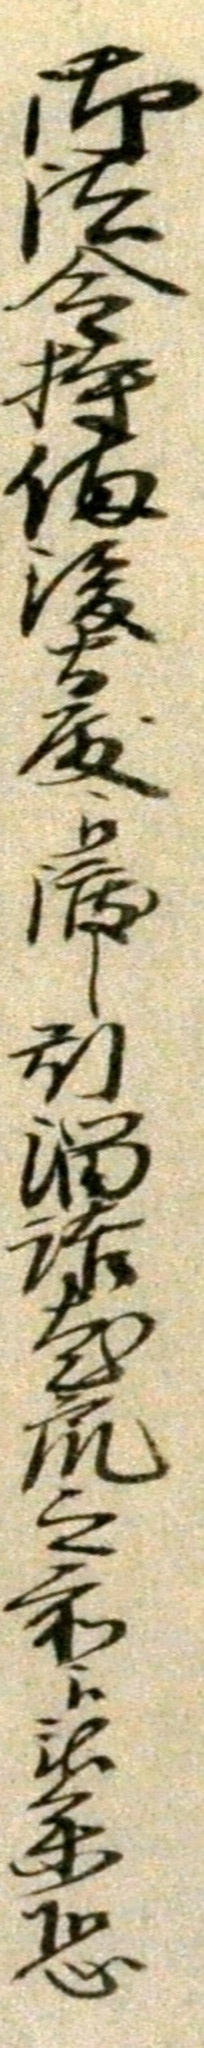御法令持備後守殿え渡し引溜詰老衆之所え被参恐
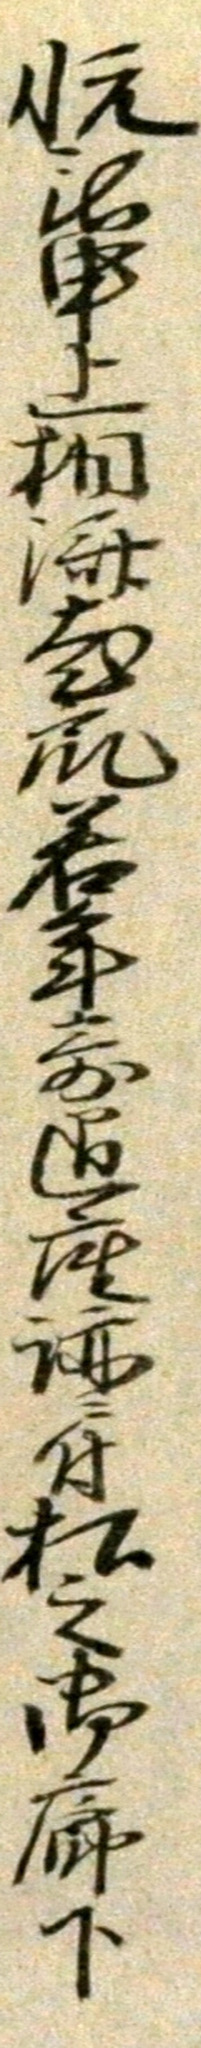悦被申上相済老衆若年寄退座跡ニ付松之御廊下
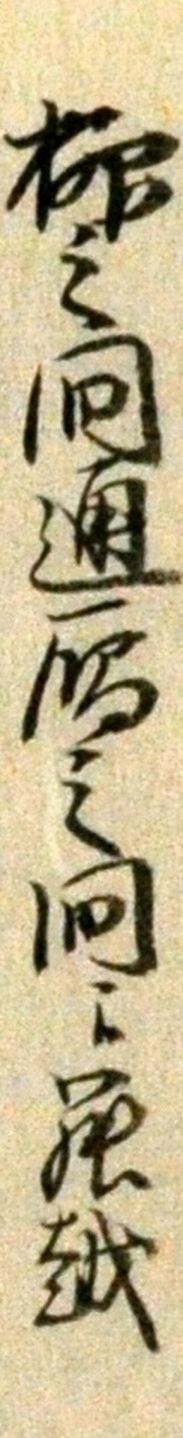柳之間通雁之間え罷越
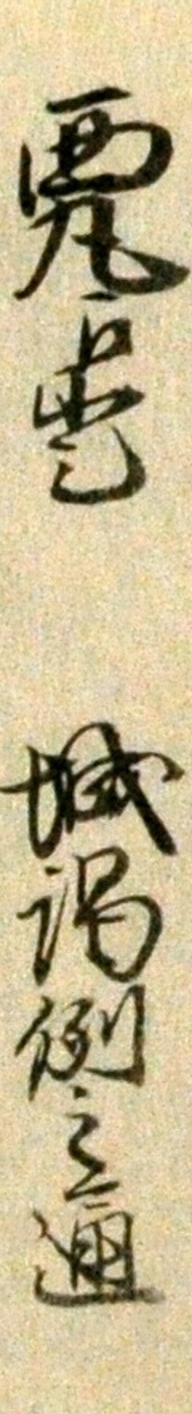西丸え登城謁例之通
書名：御代替ニ付御法令仰出サレ候節ノ留
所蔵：伊那市立高遠町図書館・合同会社AMANE
